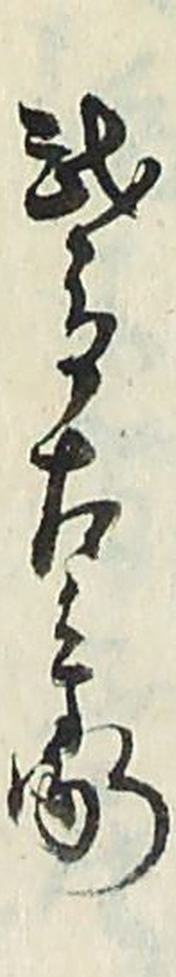武市左兵衛
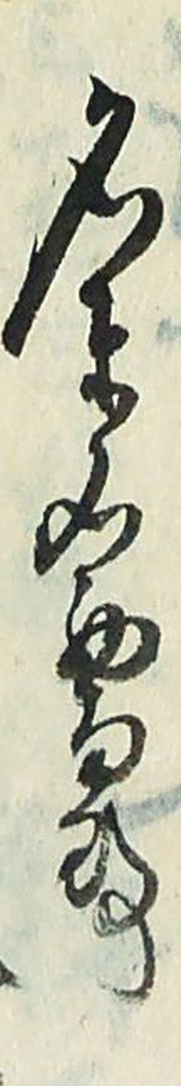名東名西両郡
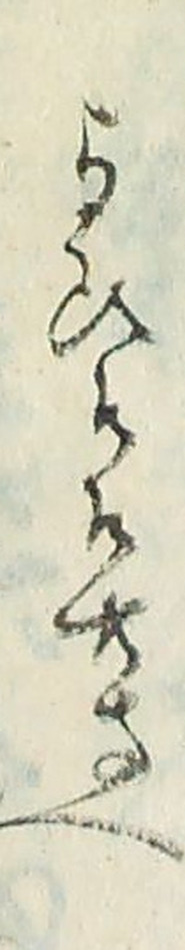与頭庄屋共方へ
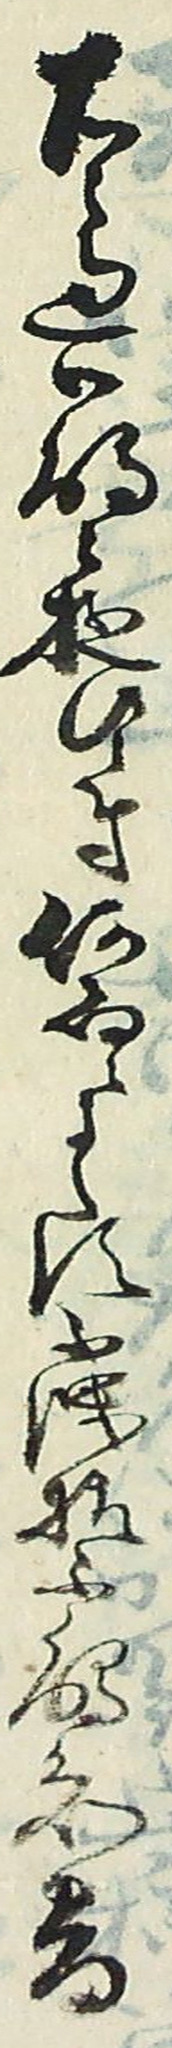右之通御触被遊候に付何者によらす不洩様不触知旨
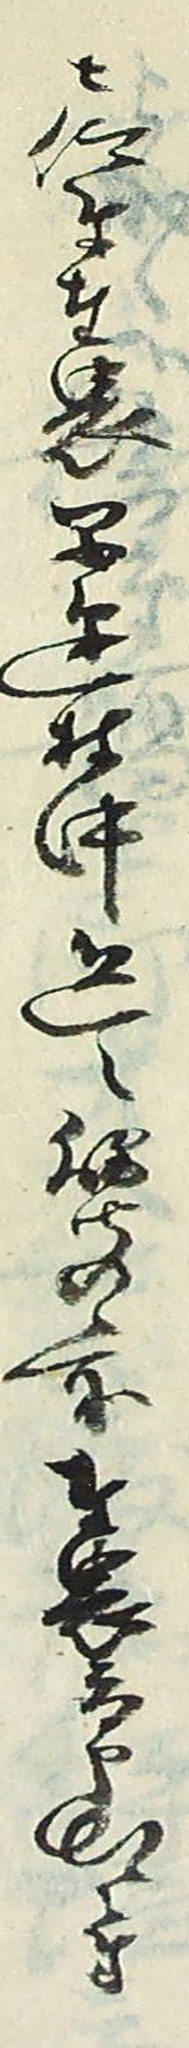被仰付奉畏早速村中逸々触聞候所奉畏旨申出候に付
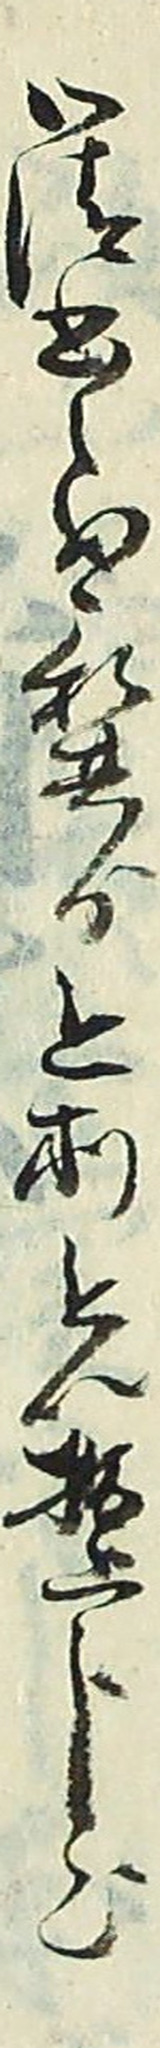御請書之義私共ゟ連判を以指上候以上
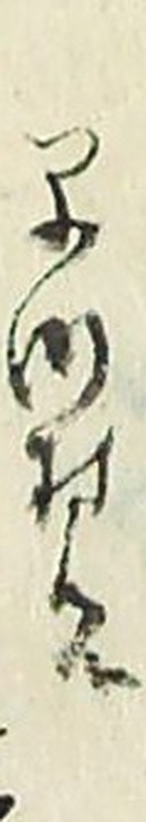早淵村庄屋
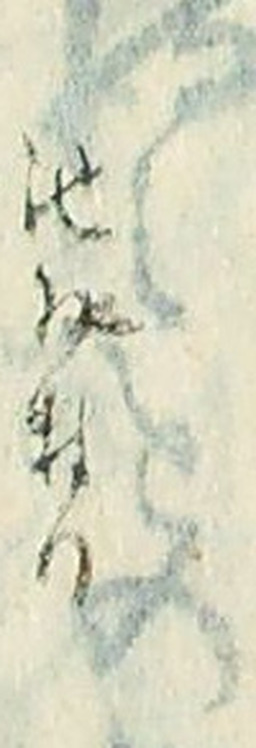池尻村同
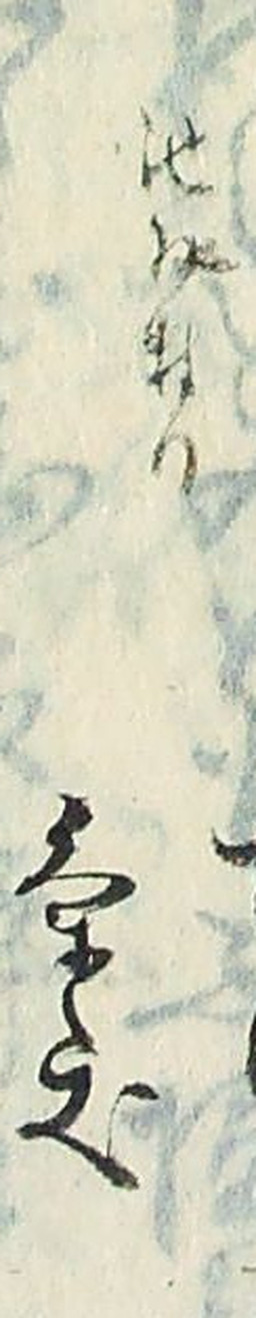久米之丈
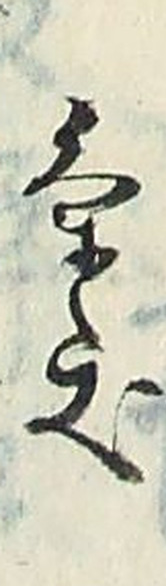久米之丈
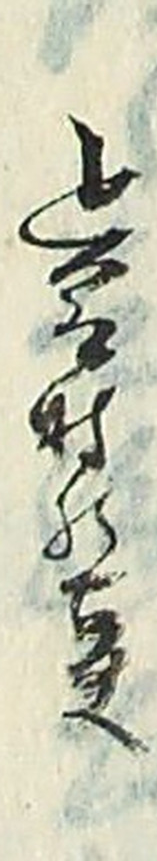延命村肝煎
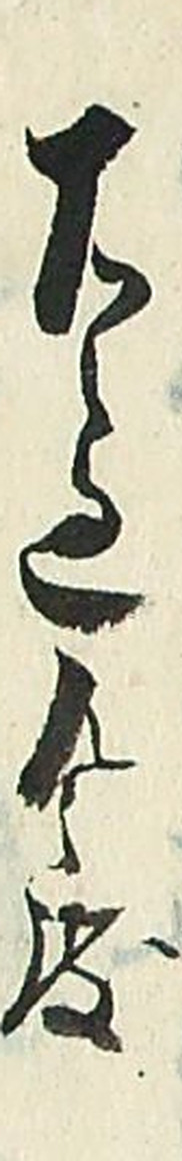右之通今度
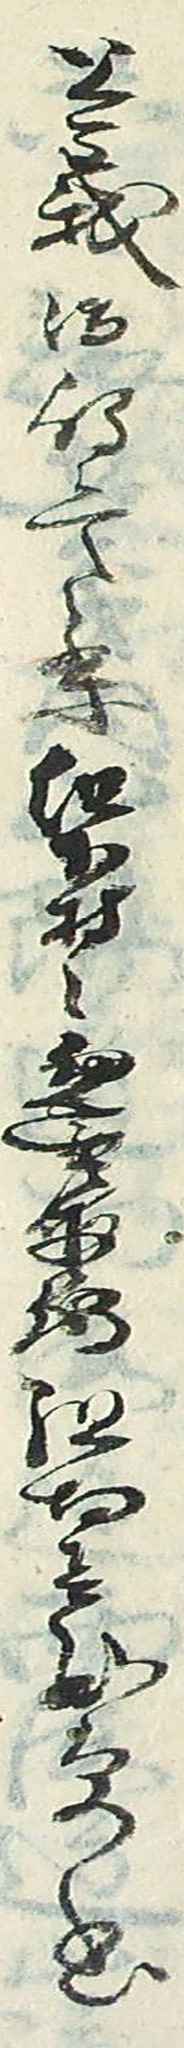公義御触有之候条組下村々逸々相触組切壱紙受書
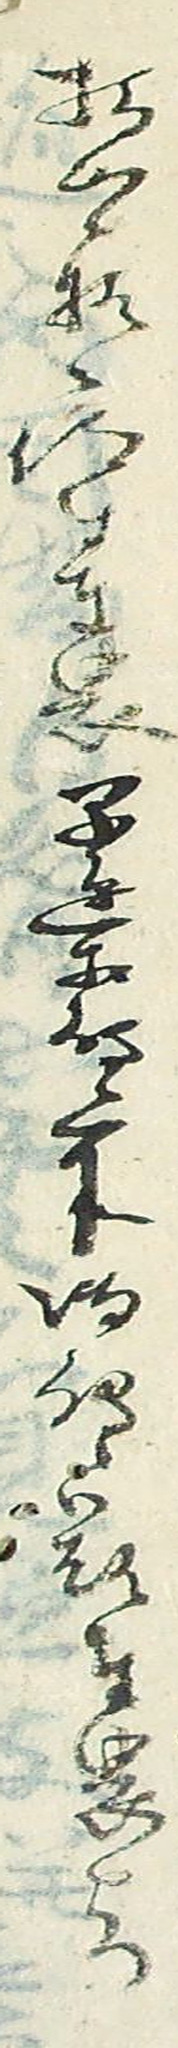指出候様被仰付奉畏早速相触候所御触候御趣奉畏旨

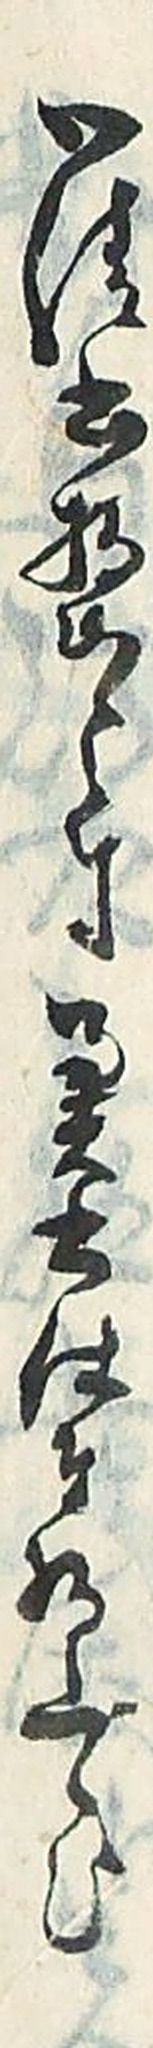御請書指出候に付奥書仕奉指上候以上
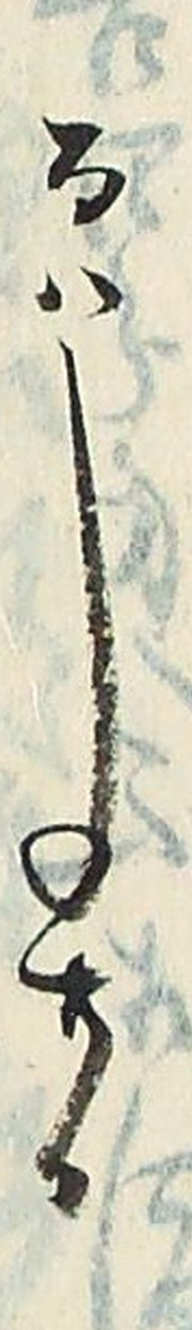酉八月廿日
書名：諸御用御□受書控
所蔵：鳴門教育大学 Naruto University of Education
